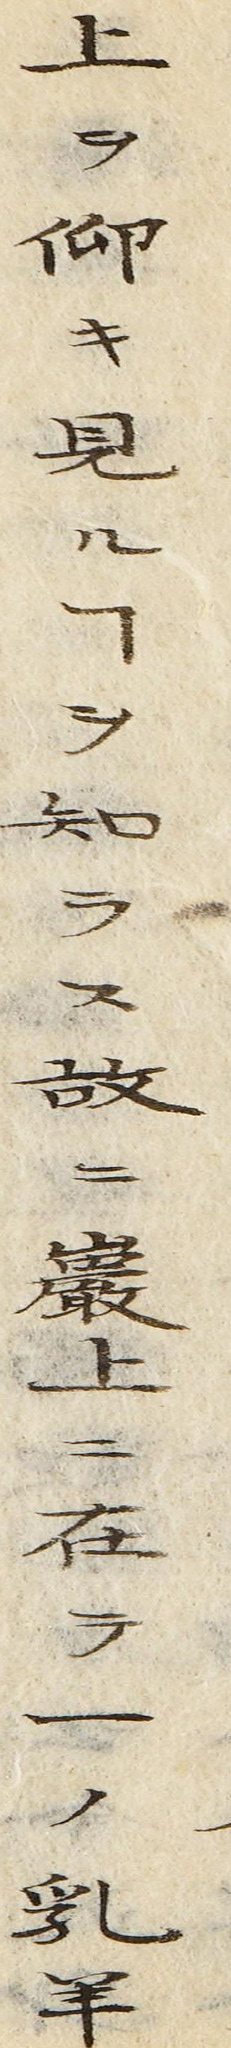上ヲ仰キ見ルコトヲ知ラス故ニ巌上ニ在テ一ノ乳羊
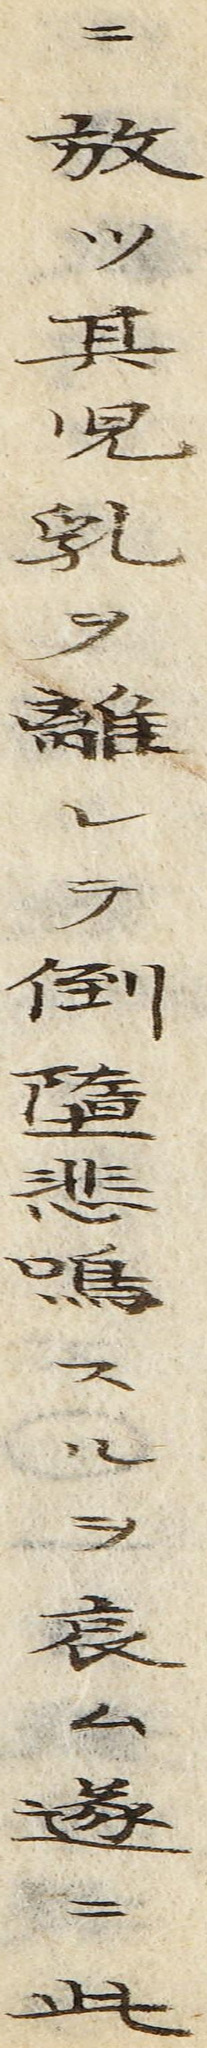ニ放ツ其児乳ヲ離レテ倒堕悲鳴スルヲ哀ム遂ニ此
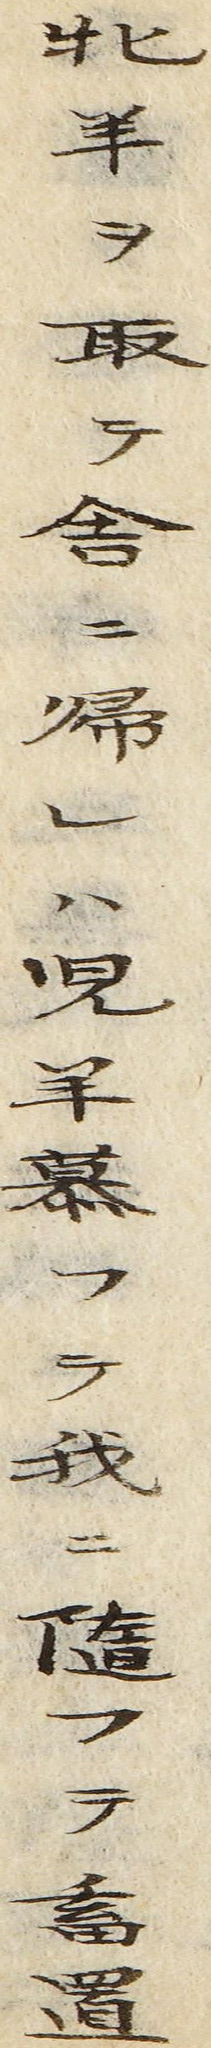牝羊ヲ取テ舎ニ帰レハ児羊慕フテ我ニ随フテ畜置
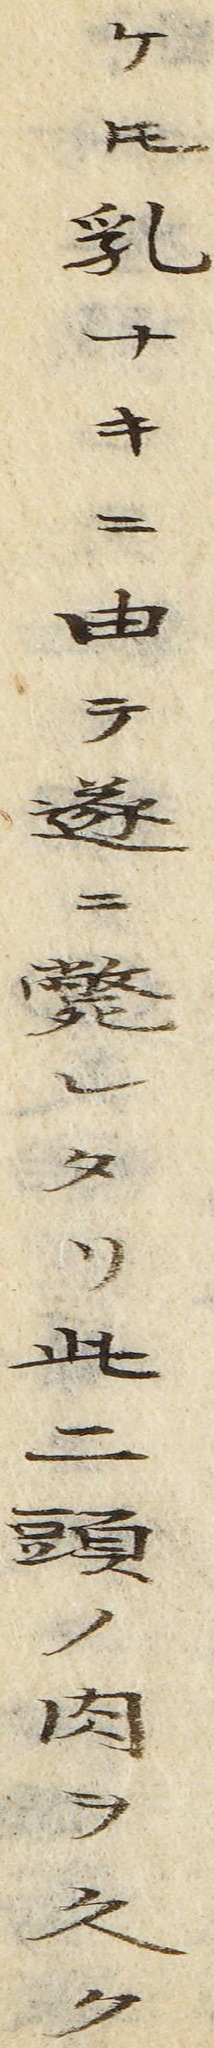ケトモ乳ナキニ由テ遂ニ斃レタリ此二頭ノ肉ヲ久ク

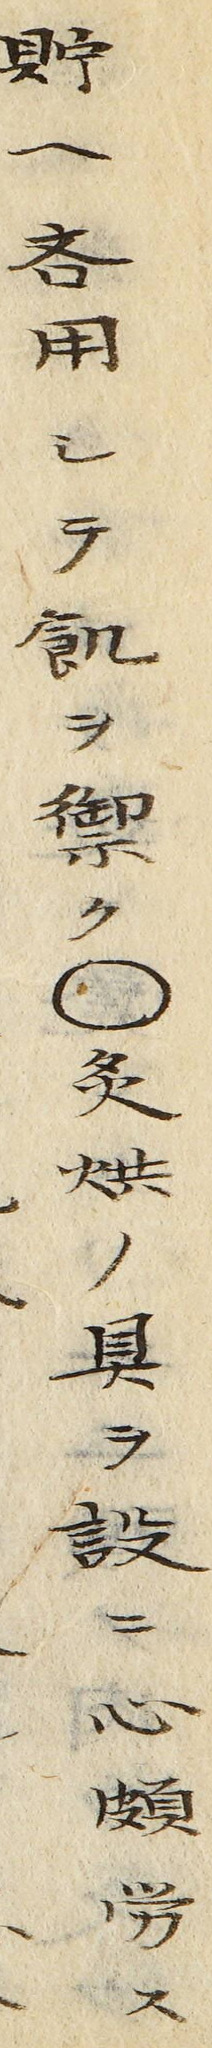貯ヘ吝用シテ飢ヲ禦ク◯炙烘ノ具ヲ設ニ心頗労ス
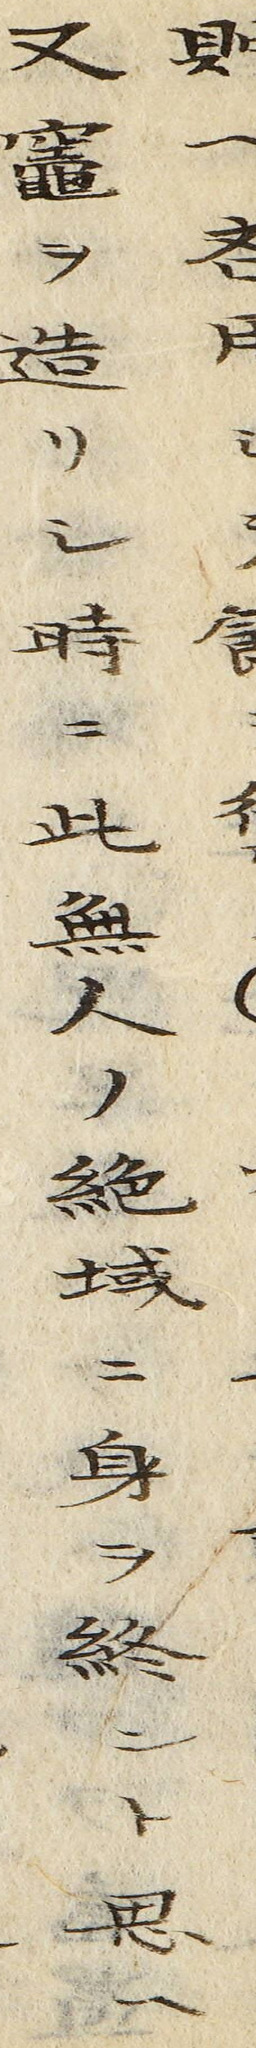又竈ヲ造リシ時ニ此無人ノ絶域ニ身ヲ終ント思ヘ
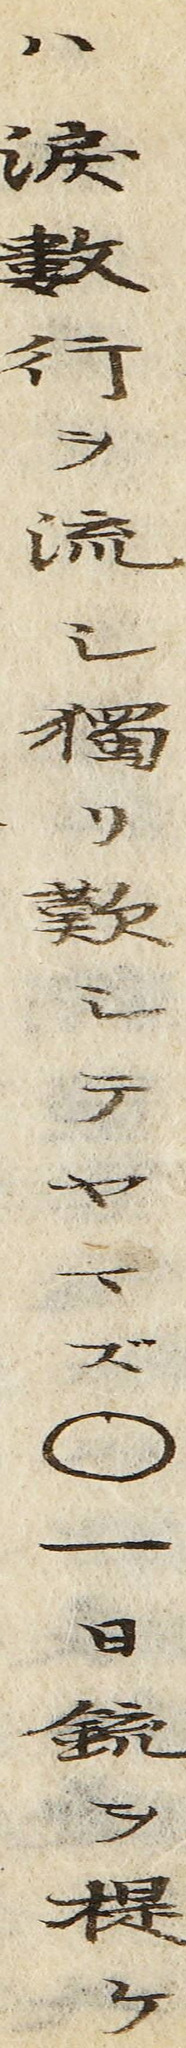ハ涙数行ヲ流シ独リ歎シテヤマズ◯一日銃ヲ提ケ
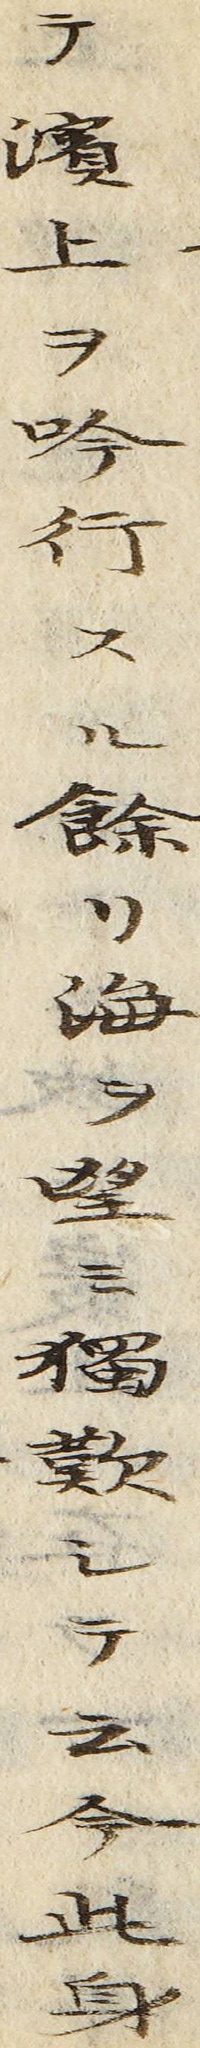テ浜上ヲ吟行スル余リ海ヲ望ミ独歎シテ云今此身
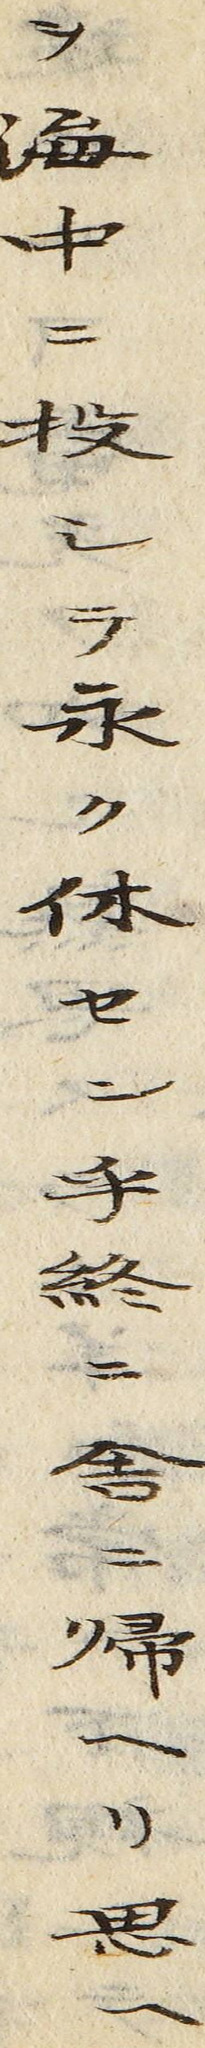ヲ海中ニ投シテ永ク休セン乎終ニ舎ニ帰ヘリ思ヘ
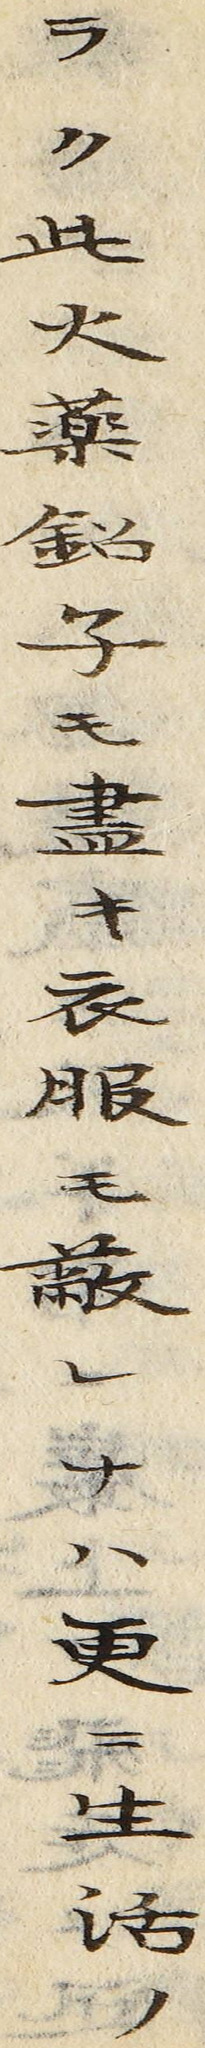ラク此火薬鉛子モ尽キ衣服モ蔽レナハ更ニ生活ノ
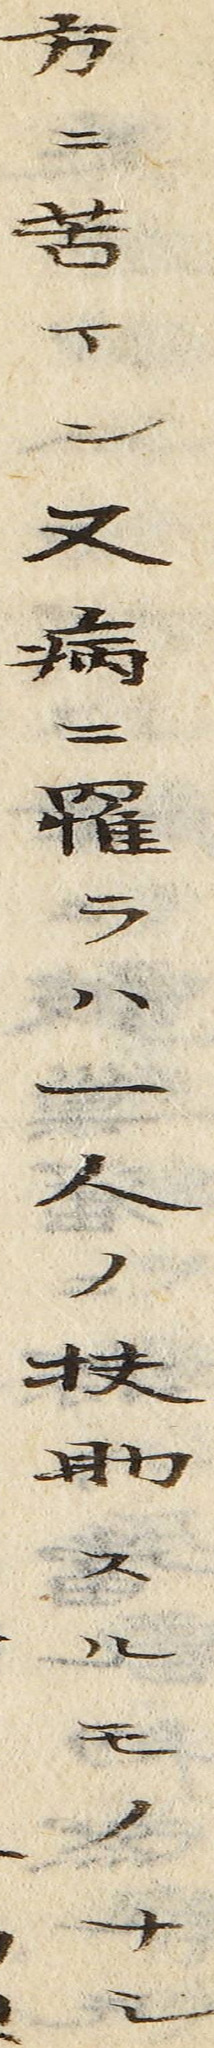方ニ苦マン又病ニ罹ラハ一人ノ扶助スルモノナシ
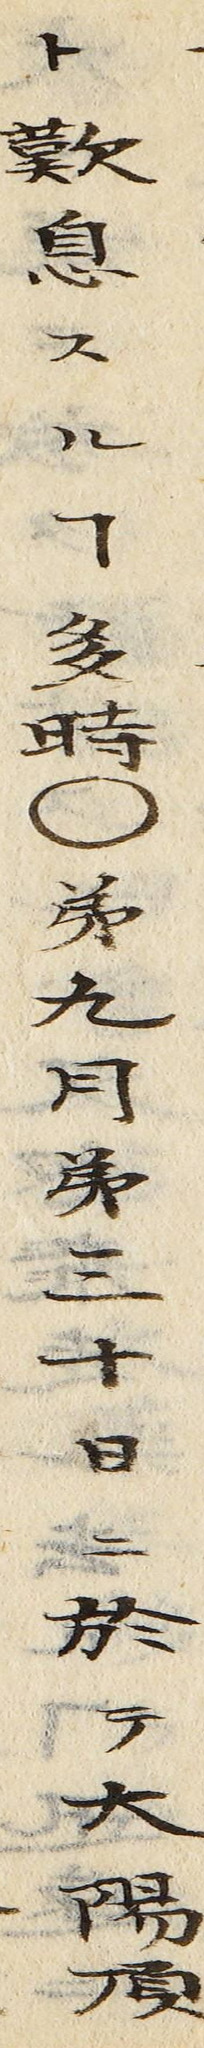ト歎息スルコト多時◯第九月第三十日ニ於テ大陽頂
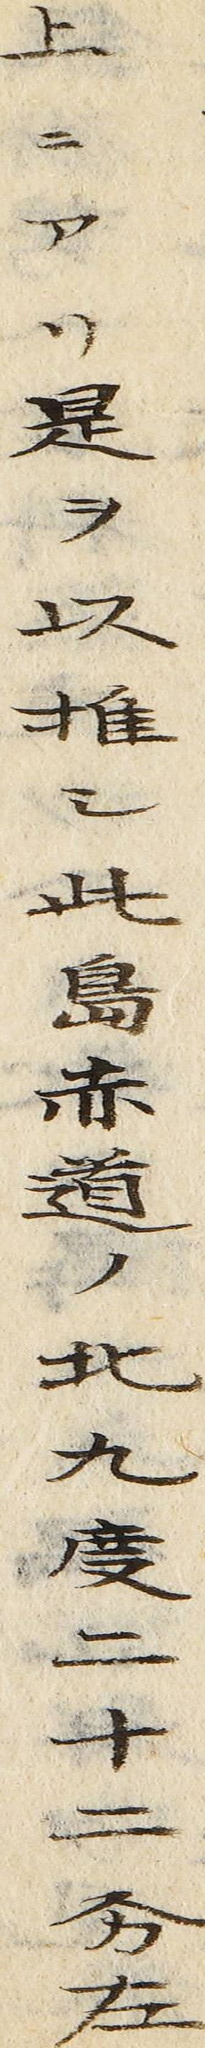上ニアリ是ヲ以推シ此島赤道ノ北九度二十二分左
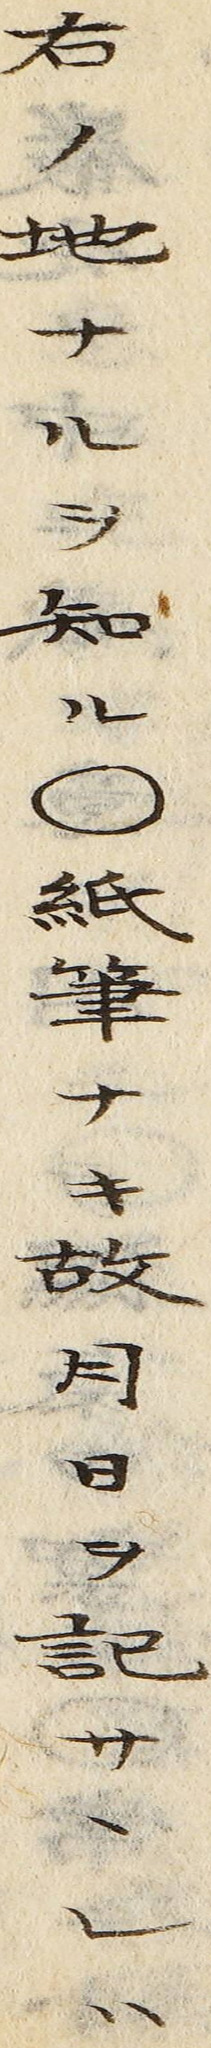右ノ地ナルヲ知ル◯紙筆ナキ故月日ヲ記サヽレハ
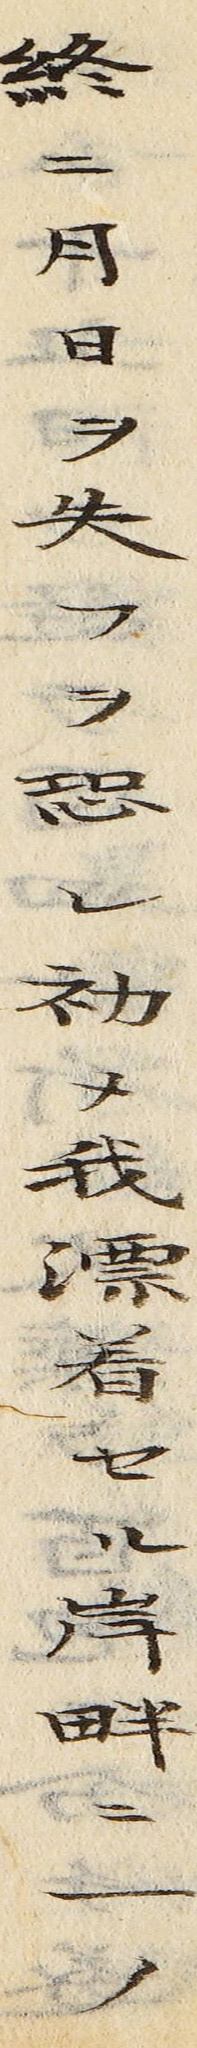終ニ月日ヲ失フヲ恐レ初メ我漂着セル岸畔ニ一ノ
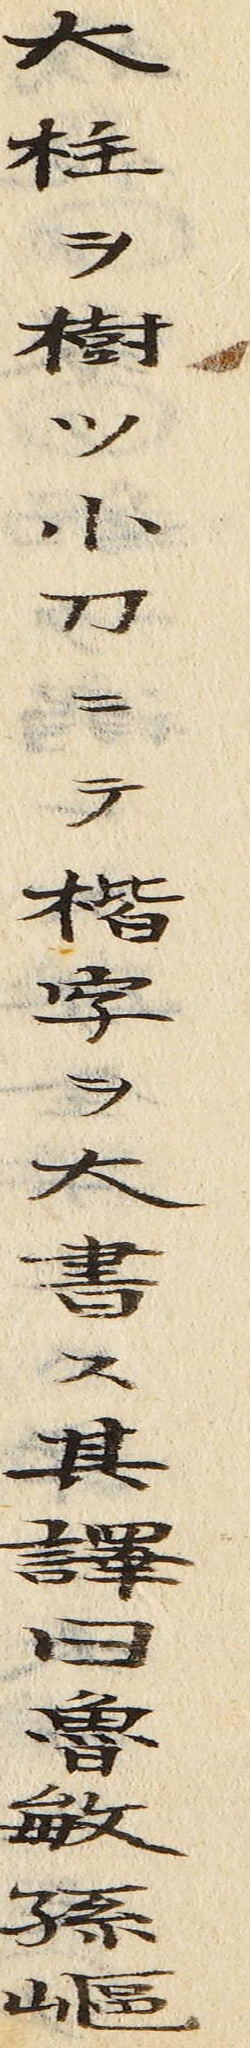大柱ヲ樹ツ小刀ニテ楷字ヲ大書ス其訳曰魯敏孫嶇
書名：漂流紀事
